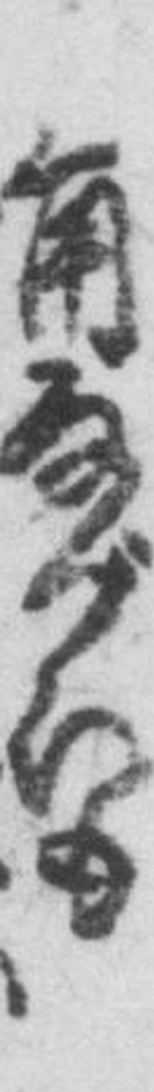角ながいも
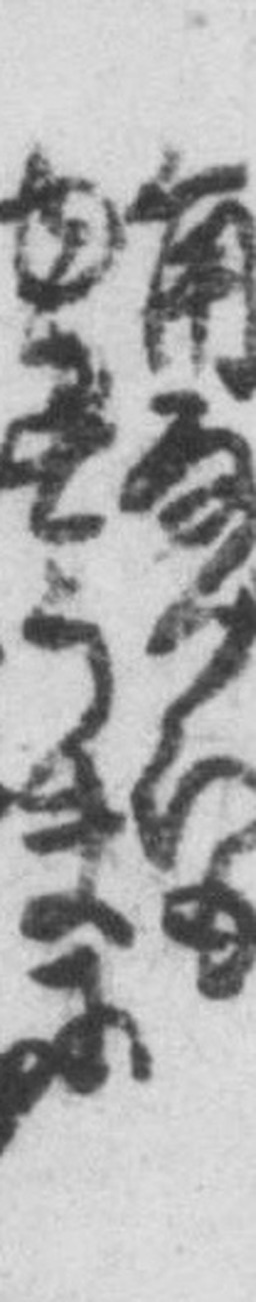ゆすうまに
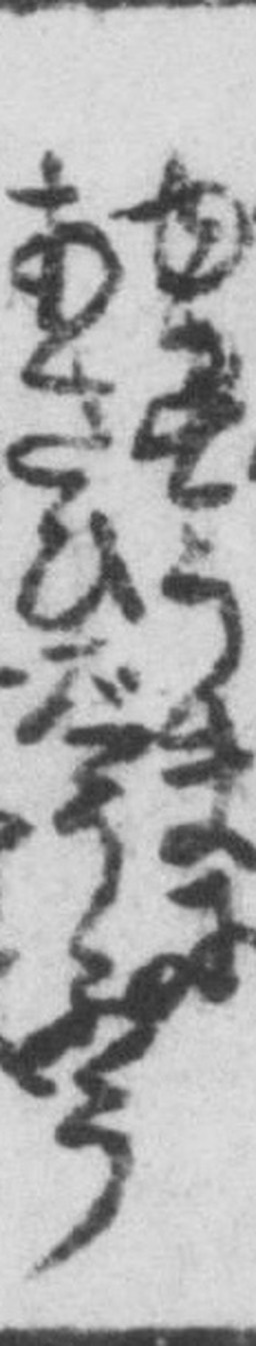七あさひばいふう
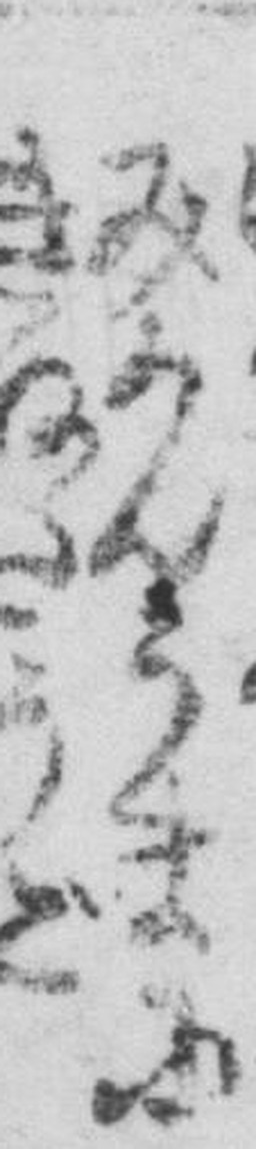きぬたうど
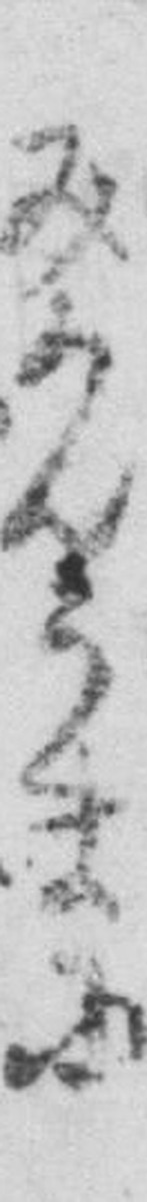みかんうまに
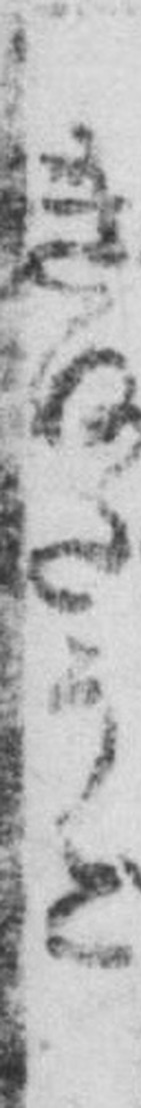きぬたうど
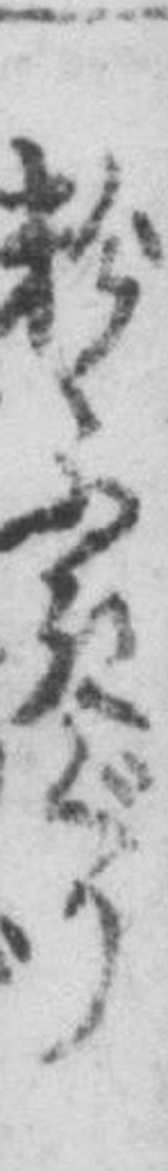粉ふきぐり
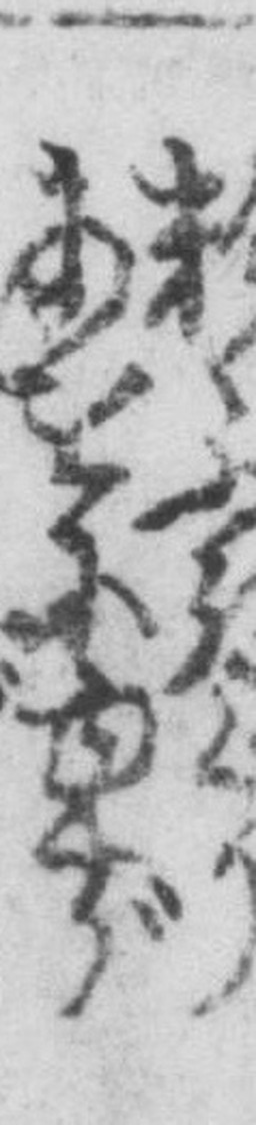あをにゆば
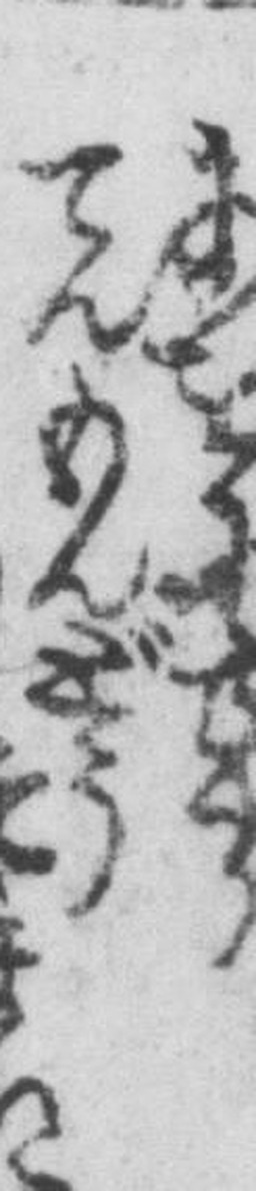てんもんどう
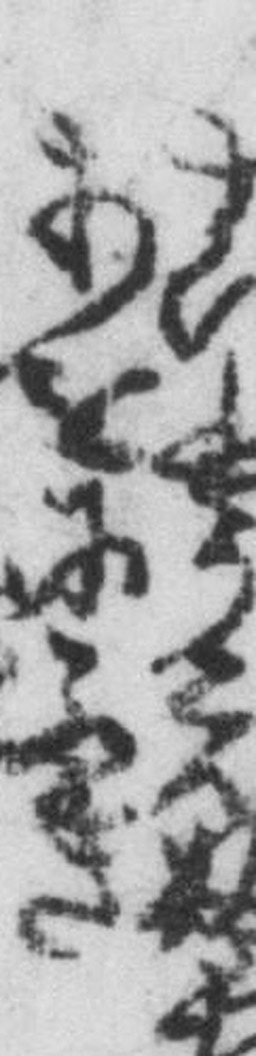あをにゆば
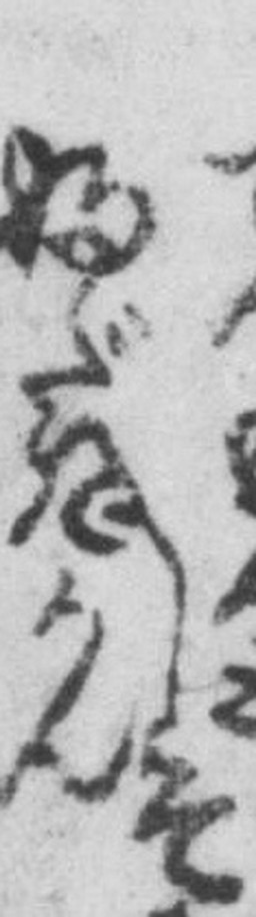ふゞきかん
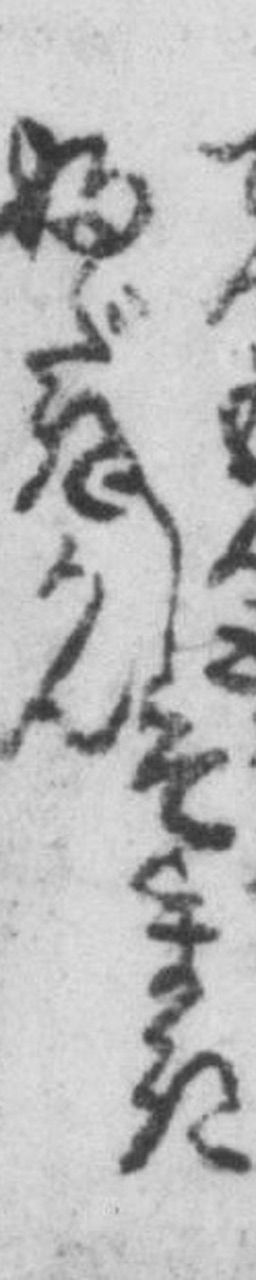ふゞきかん
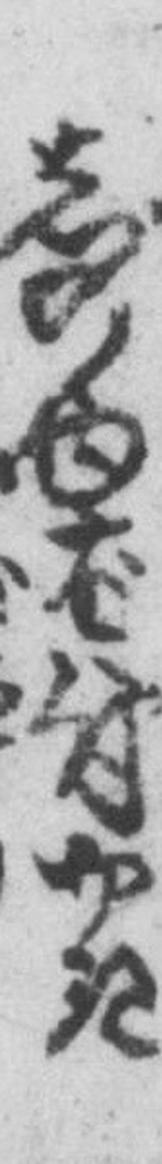色しのゆば付やき
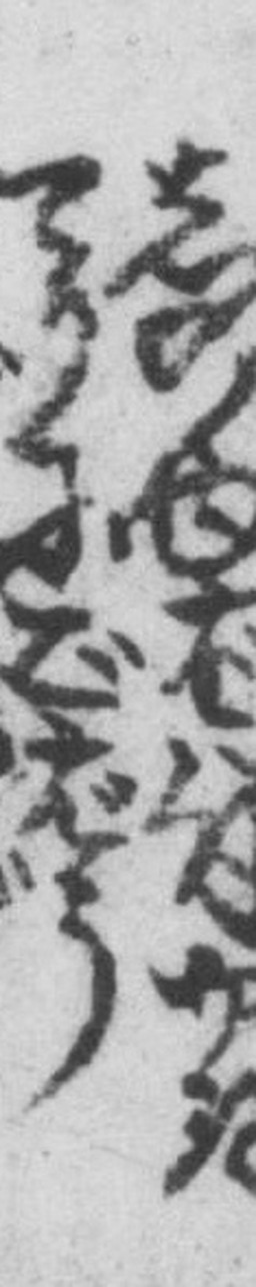てりにごばう
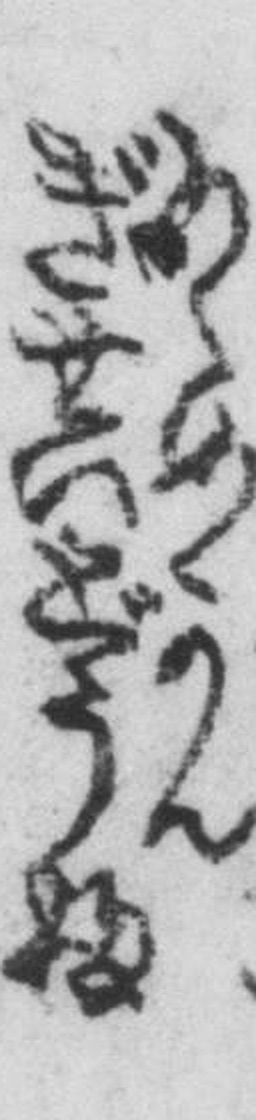ぎせいどうふ
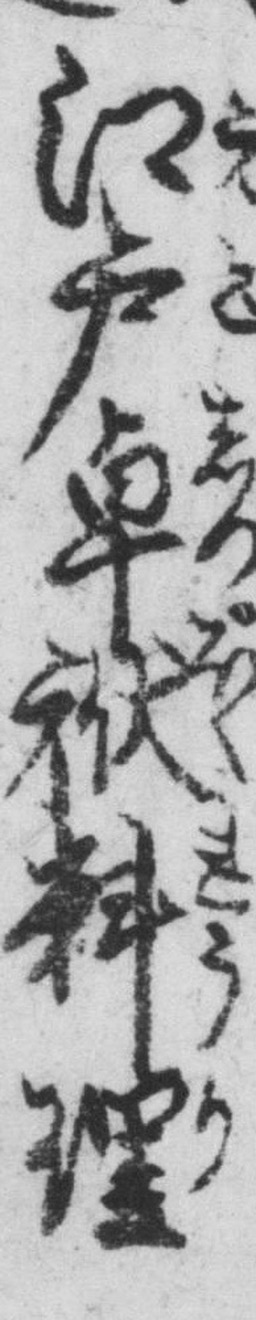江戸卓袱料理
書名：即席庖丁
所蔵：大阪府立大学学術情報センター 国文学研究資料館
